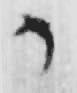人
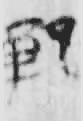○（範）
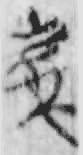慶
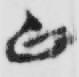㠯（以）
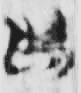○（廷）
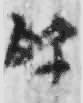阩
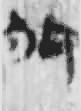門
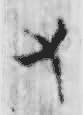又
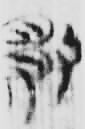敗
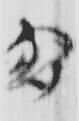宵
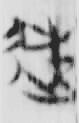逆
